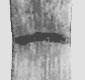一
